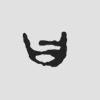曰
